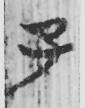子
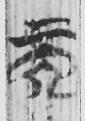而
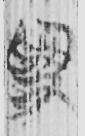受
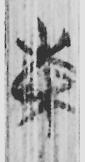柬
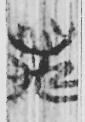萬
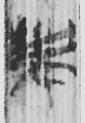民
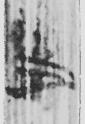之
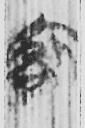{宀咎}
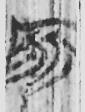所
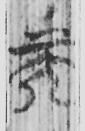而
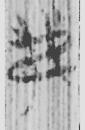弗
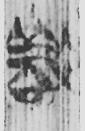敬
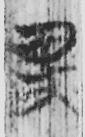卑
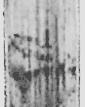之
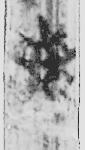若
